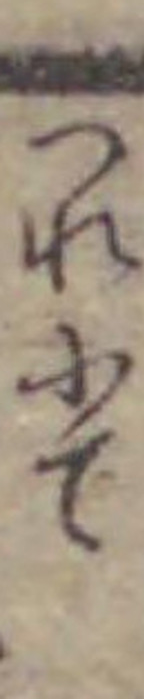つれにて
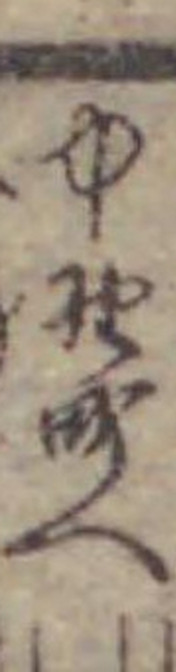中野町へ
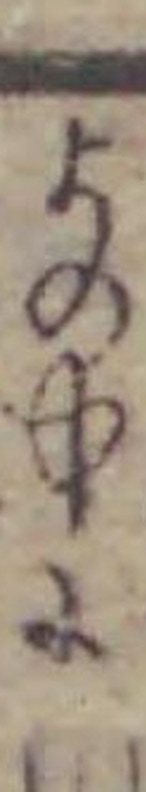よの中に
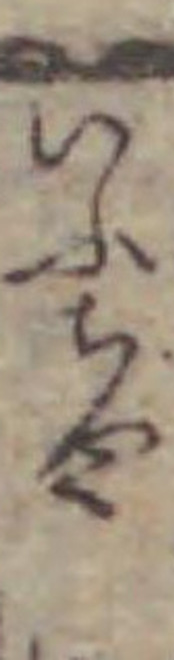いふちや
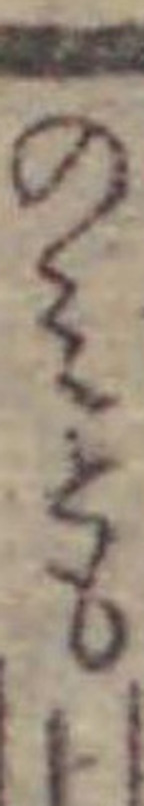のみとも
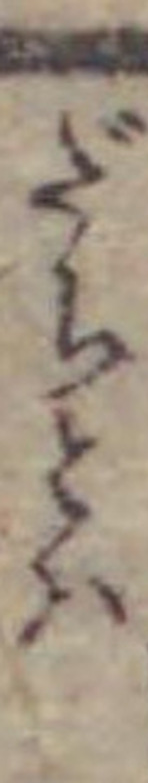だちとは
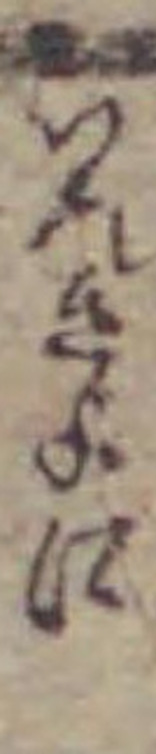いんきよに
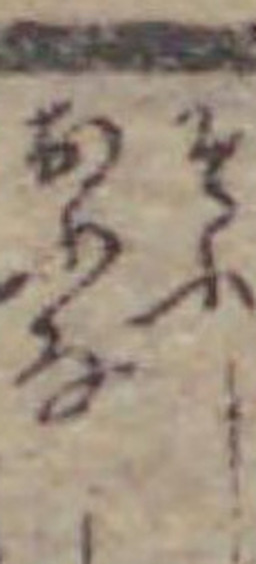おふな
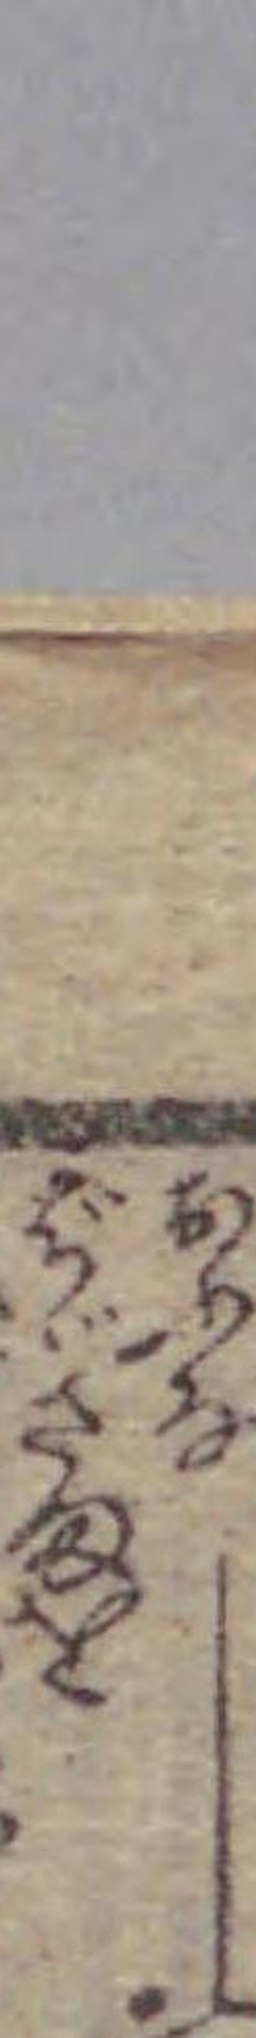ぢゞさまを
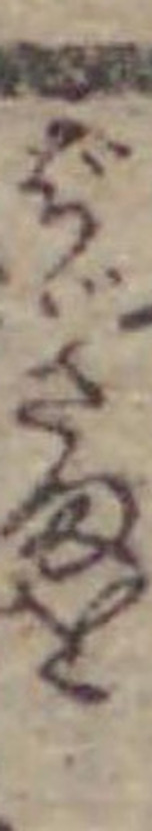ぢゞさまを
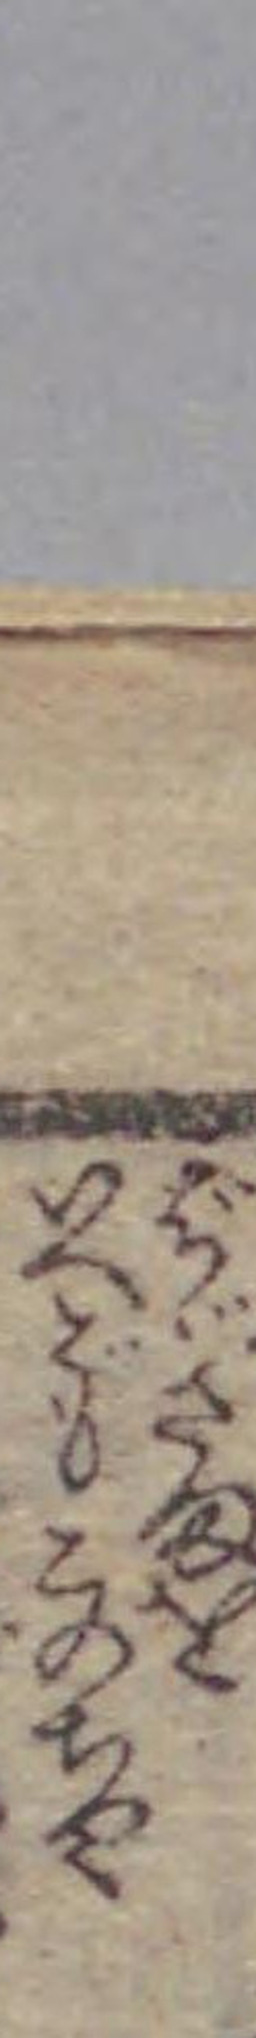いへどもこのちや
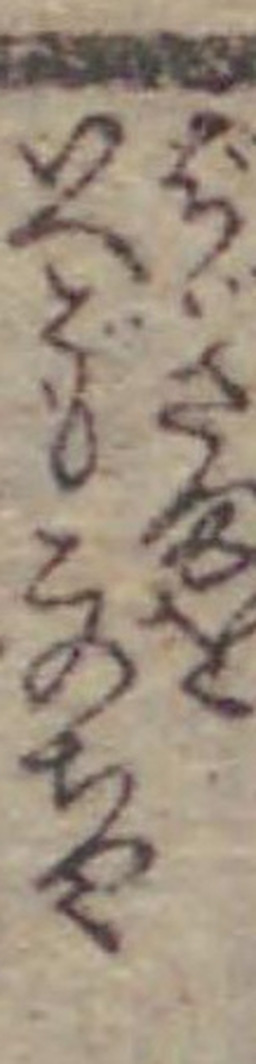いへどもこのちや
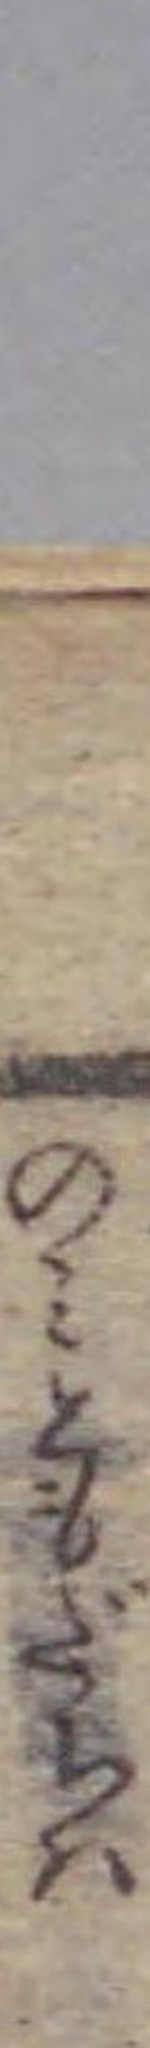のみともだちは
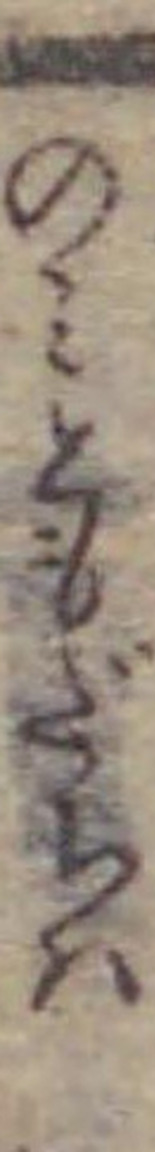のみともだちは
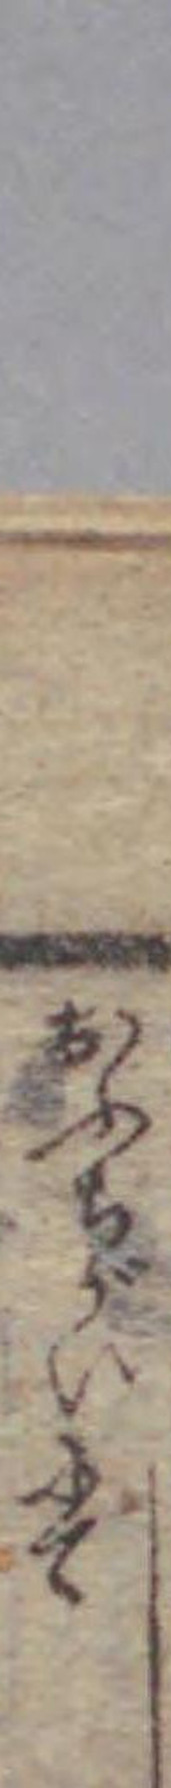おふちがいにて
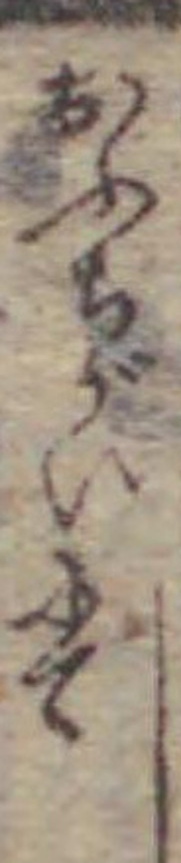おふちがいにて
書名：見通占 : 3巻
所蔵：国立国会図書館 National Diet Library, JAPAN
